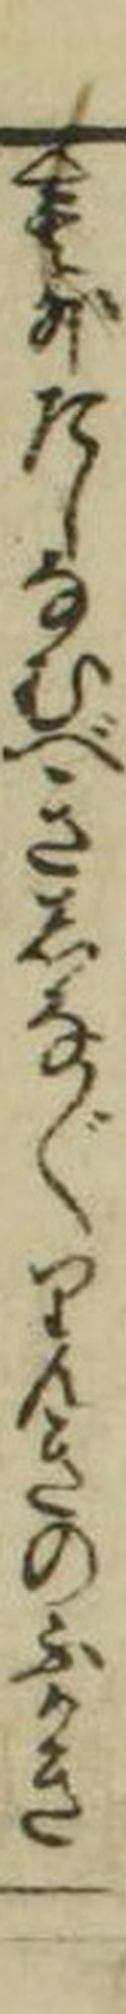△其外たしなむべきしな〴〵りんきのふかき
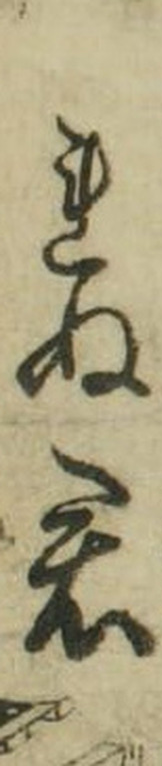れぬ君
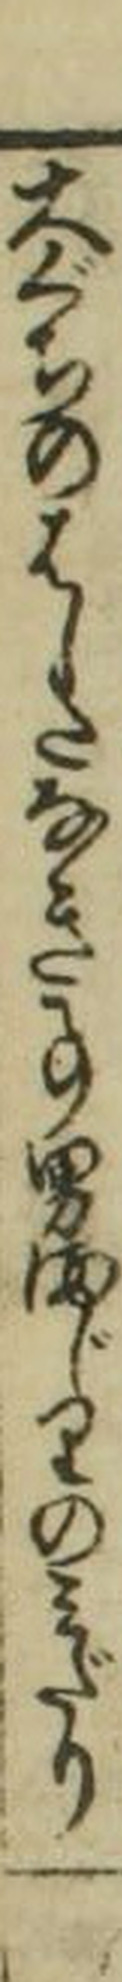大ぐちのはしたなき事男まじりのみだり

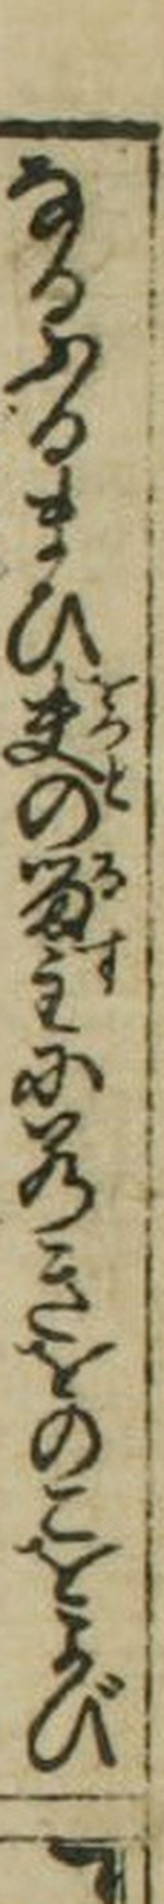なるふるまひ夫の留主に若きをのこをよび
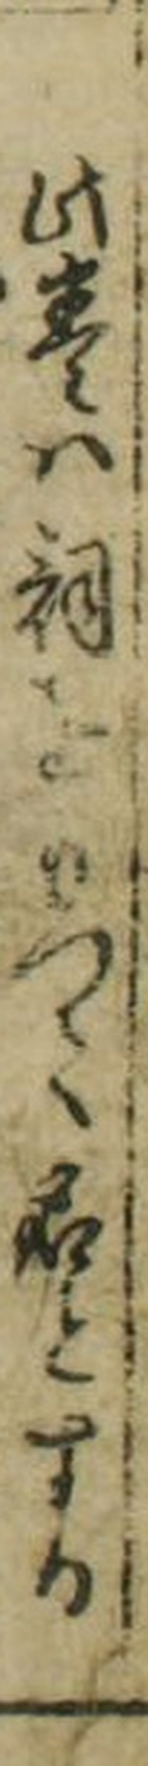此巻は詞をもつて名とする
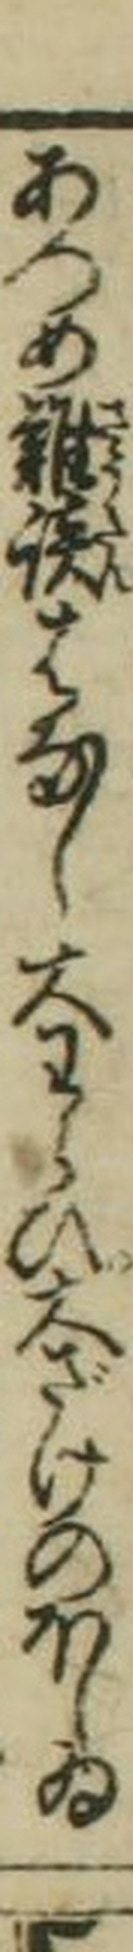あつめ雑談はなし大わらひ。大ざけのほしゐ
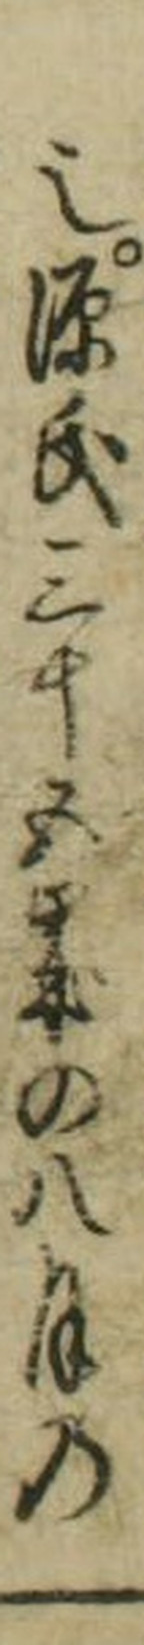也。源氏三十五歳の八月の
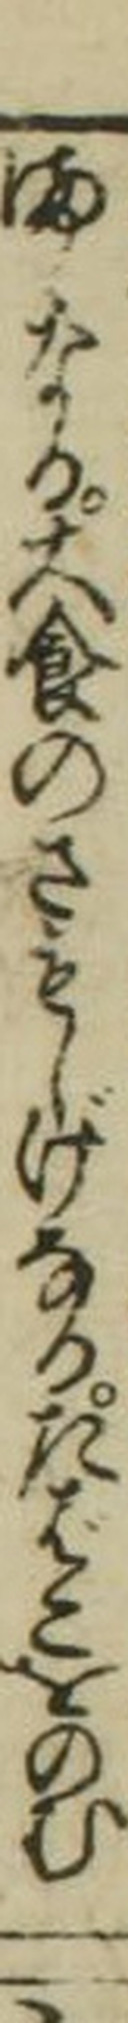まゝなる。大食のさもしげるり。たばこをのむ
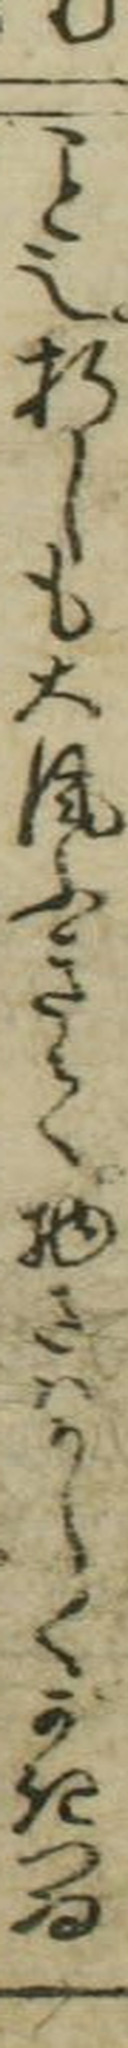こと也。折しも大風ふきて。物さはかしくかきつる
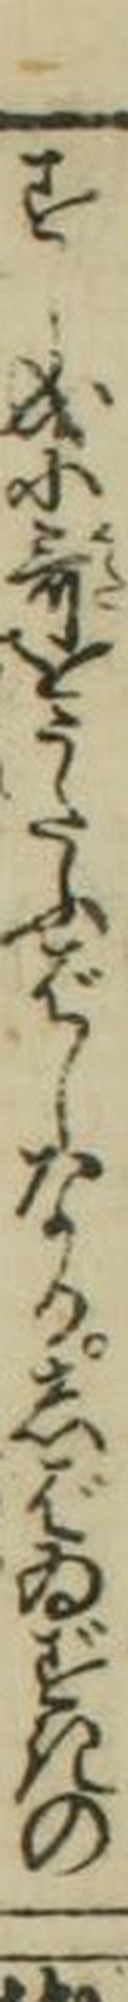すゝ成に哥をうたふばしなる。しばゐずきの
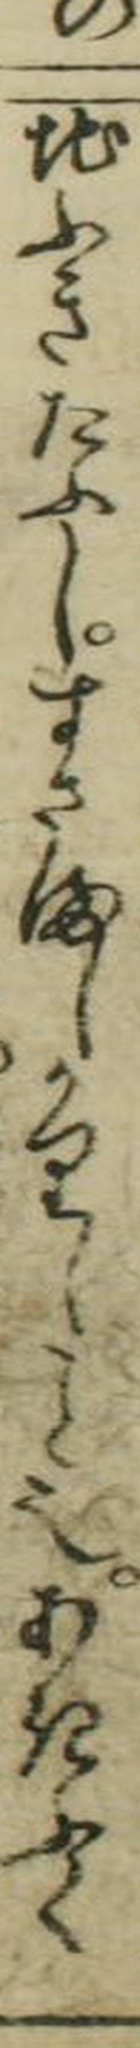地ふきたふし。すさましかりしこと也。あきふく
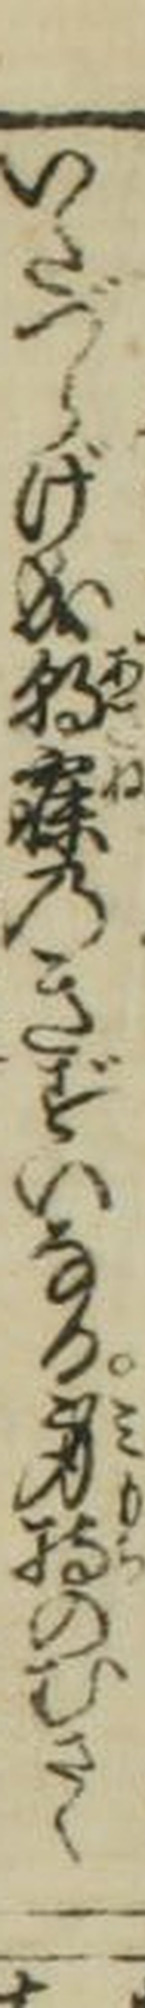いたづらげ成朝寐のきずいなる。身持のむさく
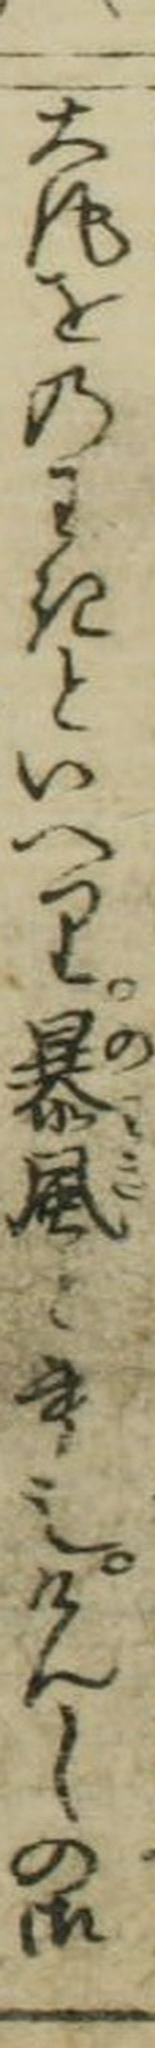大風をのわきといへり。暴風と書也。けんしの御
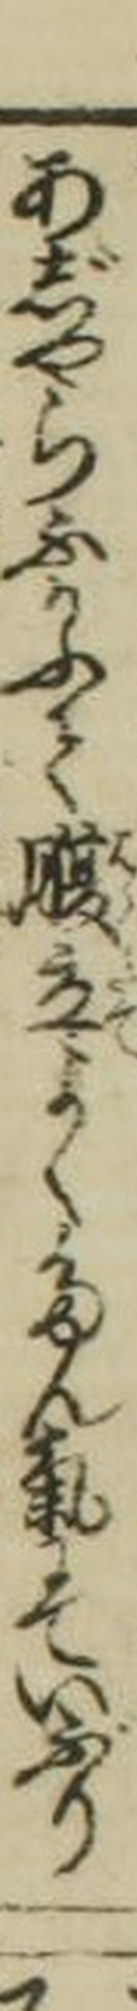あじやらふかふて腹立よくたん気にていぶり
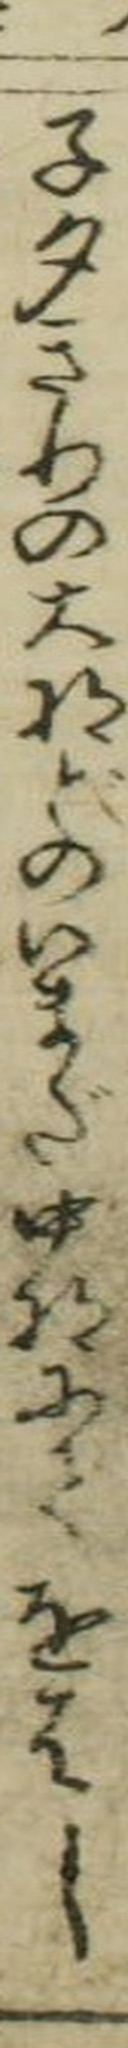子夕きりの大将どのいまだ中将にてをはし
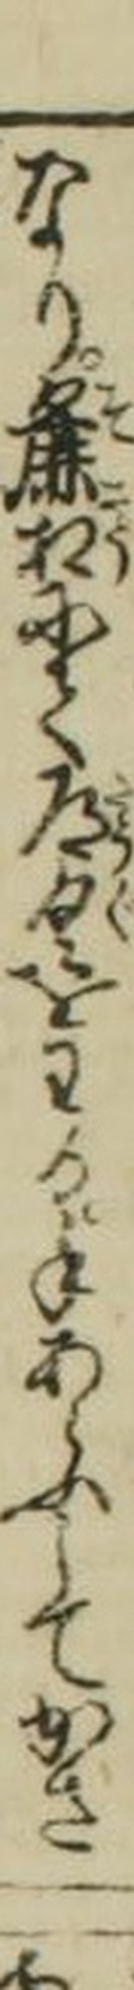なり。麁相にて道具をわる。手あらふしてかさ
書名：女源氏教訓鑑
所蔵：東京学芸大学附属図書館
